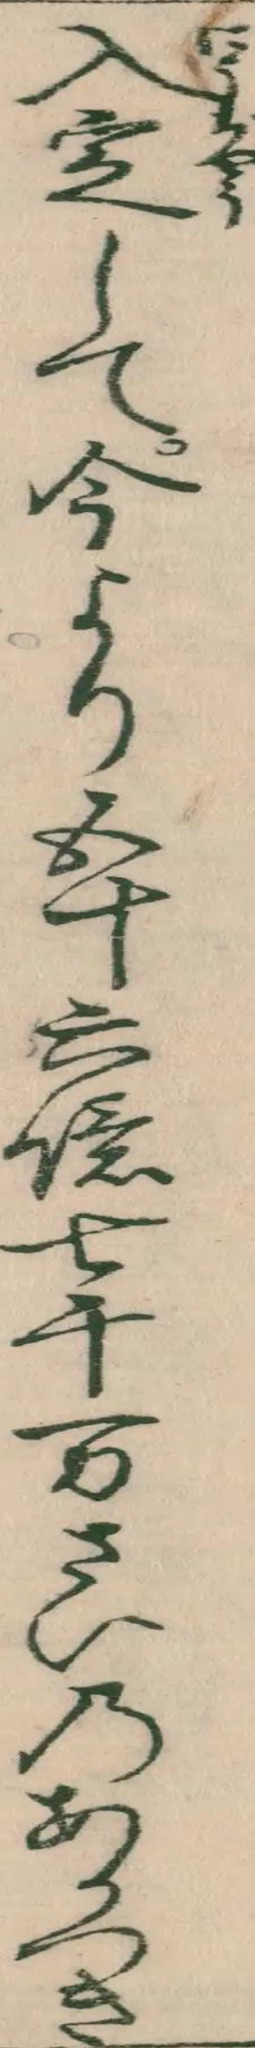入定して。今より五十六億七千万さいのあかつき
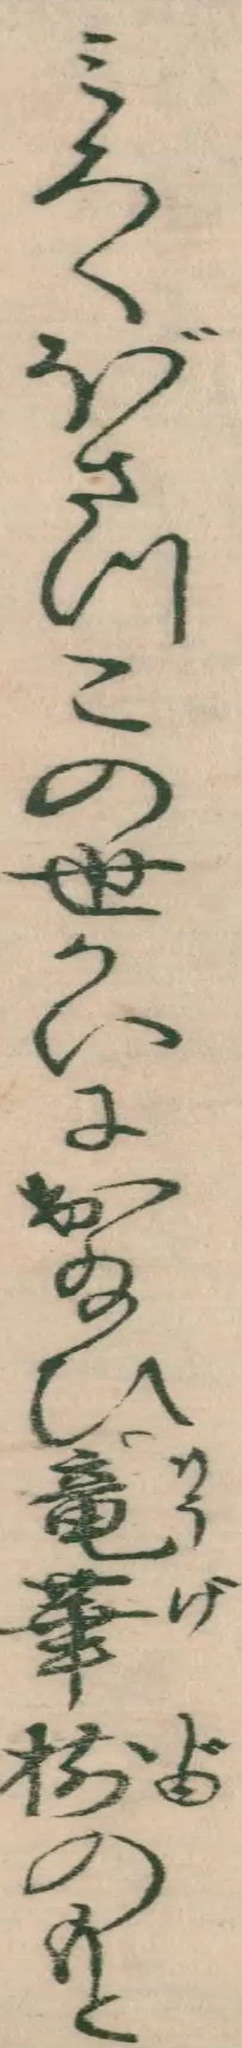みろくぼさつこの世かいに出給ひ竜華樹のもと
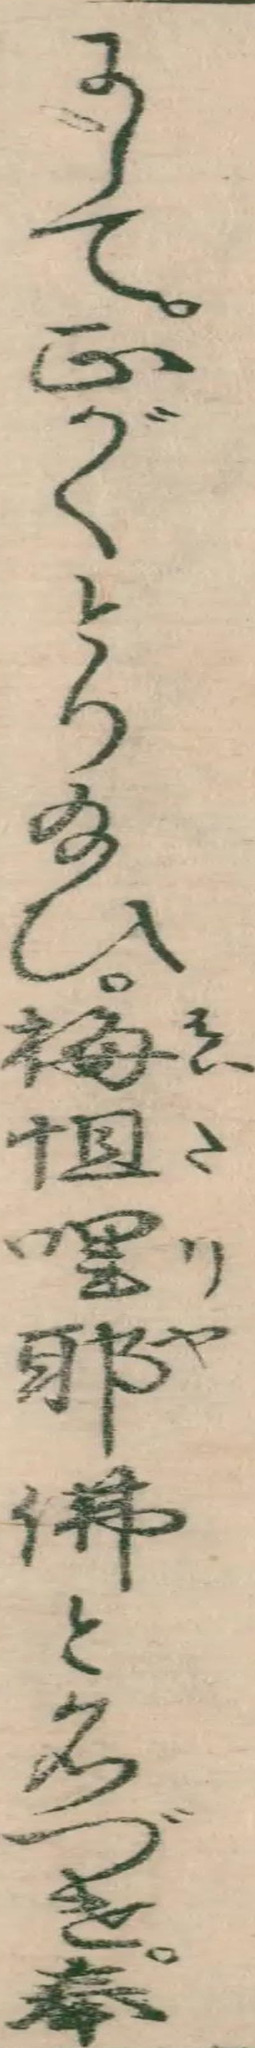にして。正がくとり給ひ。梅怛哩耶仏と名づけ。奉
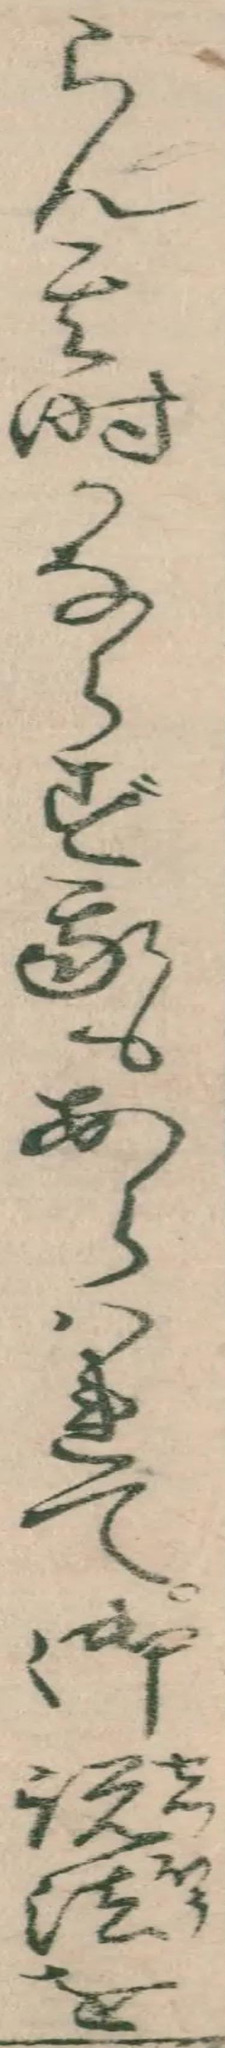らん其時かならず我もあらはれて。御説法を
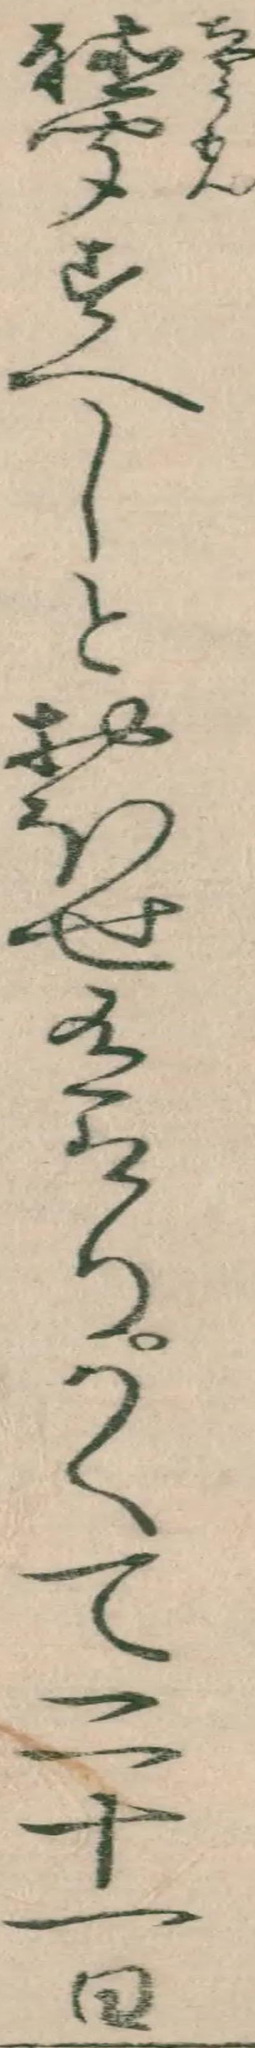聴聞すへしとおほせ有けり。かくて二十一日
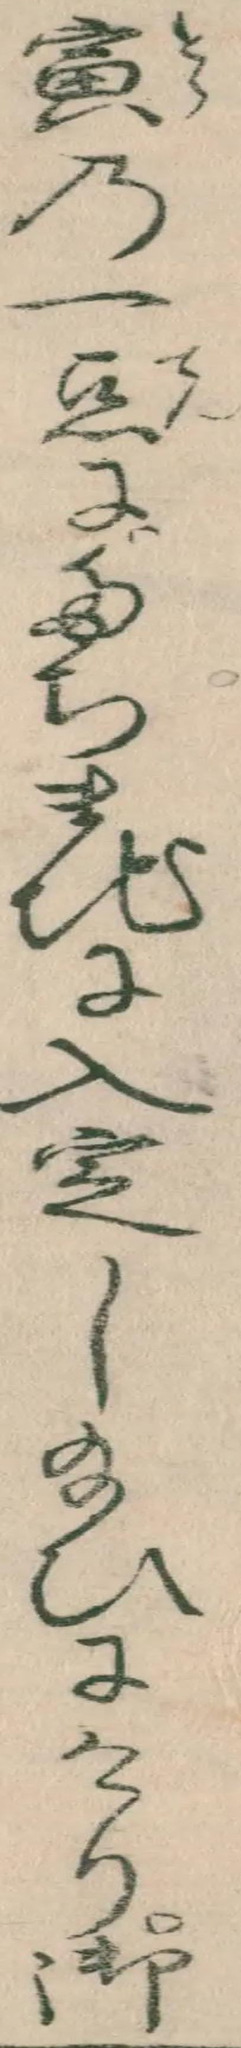寅の一点に。たちまちに入定し給ひにけり。御
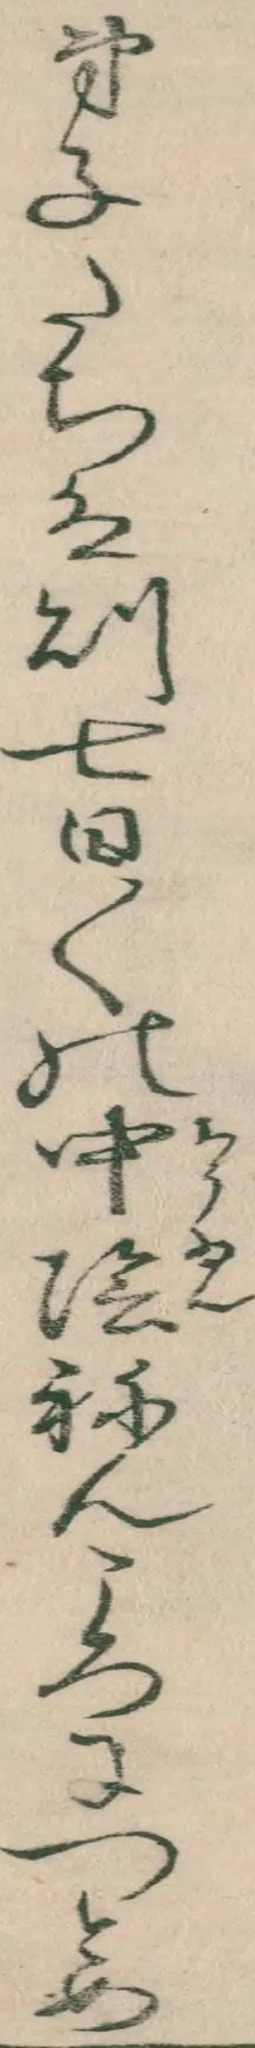弟子たちは則七日〳〵の中陰ねんころにつとめ
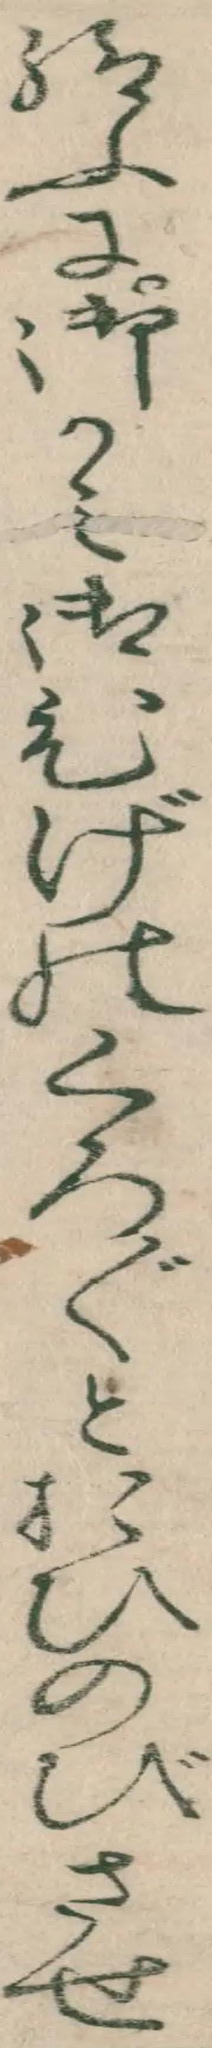給ふに。御かみ御ひげのくろ〴〵とおひのびさせ
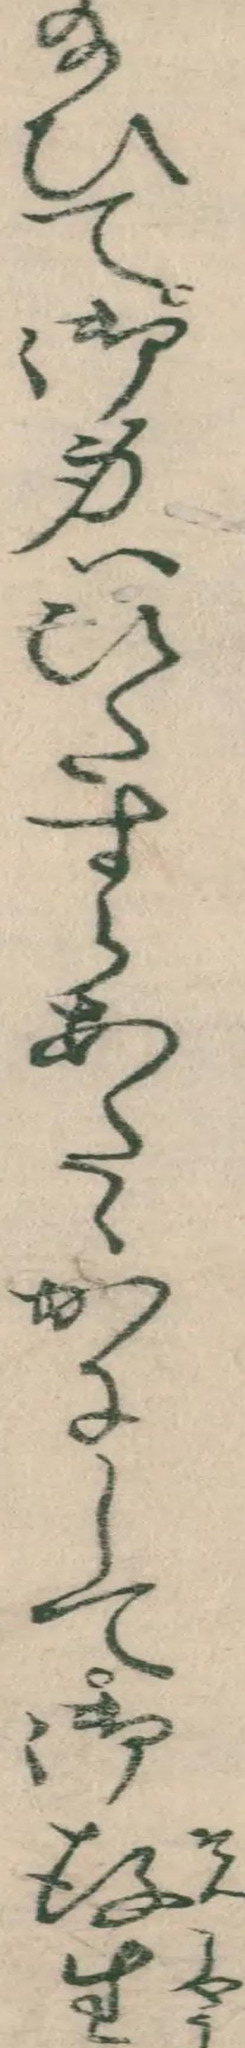給ひて。御身はひたすらあたゝかにして。御存生
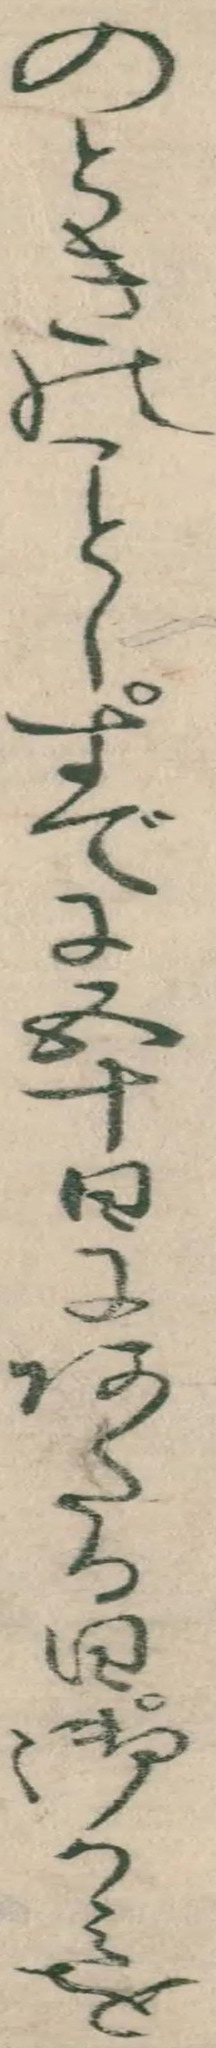のときのことし。すでに五十日にあたる日。御かみを
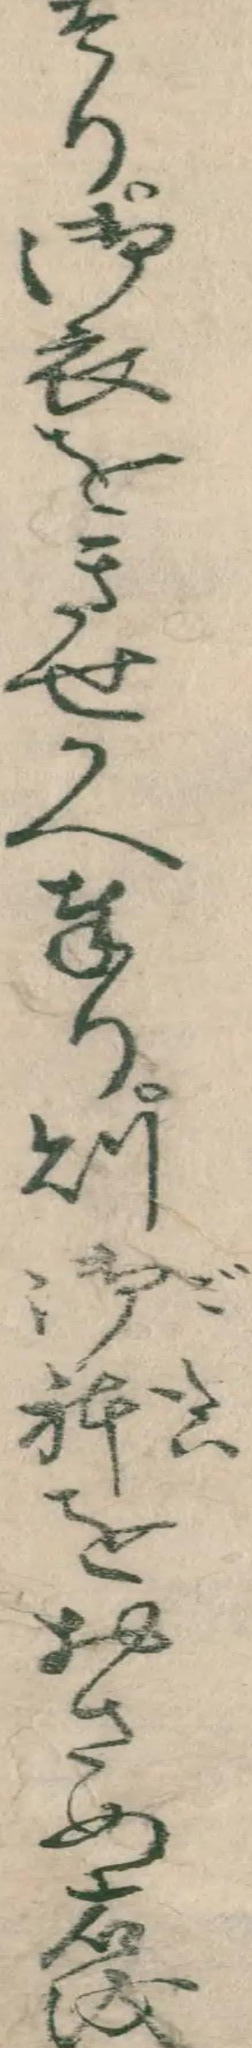そり。御衣をきせかへ奉り。則御体をおさめ衣を
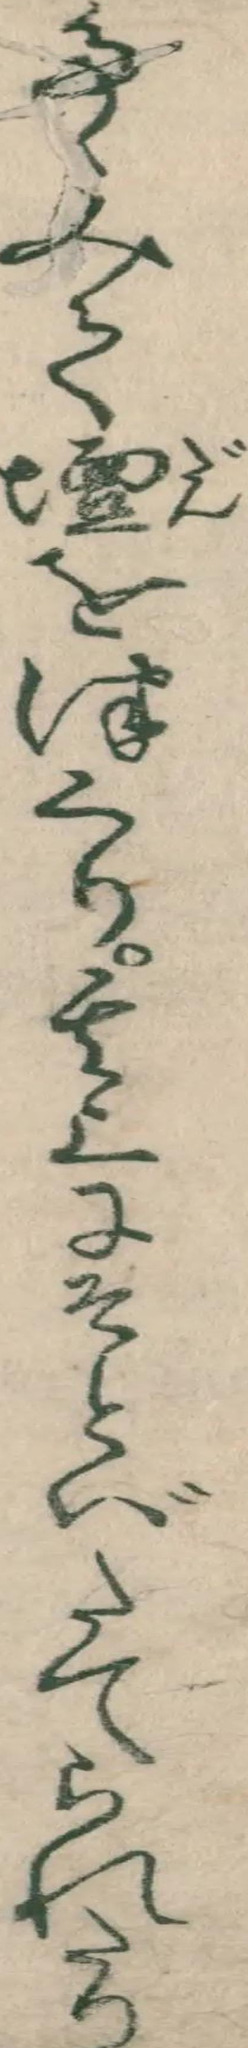たゝみて壇をつくり。其上にそとばたてられたり

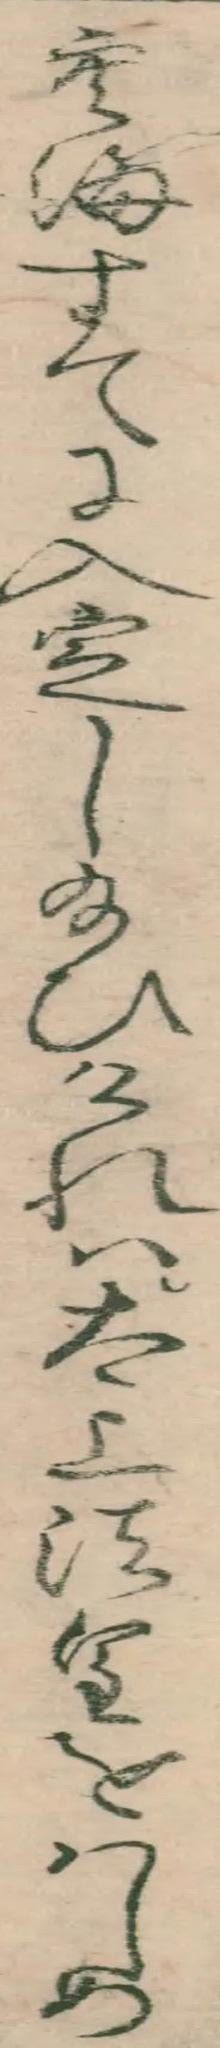空海すてに入定し給ひけれは。太上法皇をはしめ
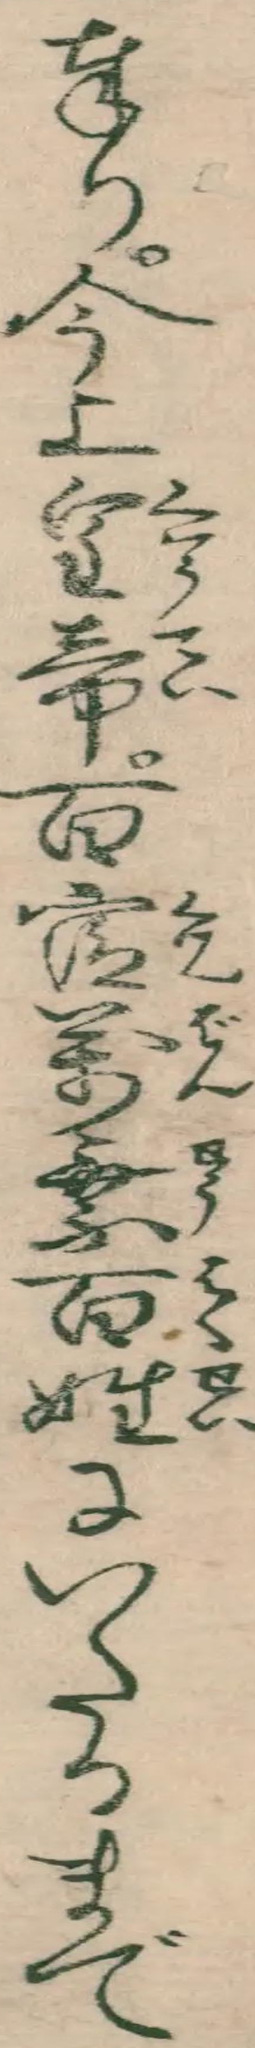奉り。今上皇帝。百官万乗百姓にいたるまで
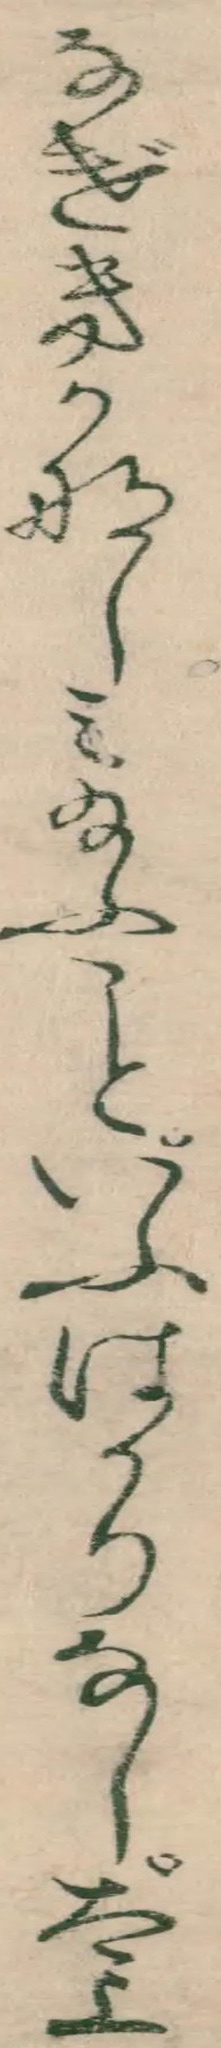なげきかなしみ給ふこと。いふはかりなし。太上
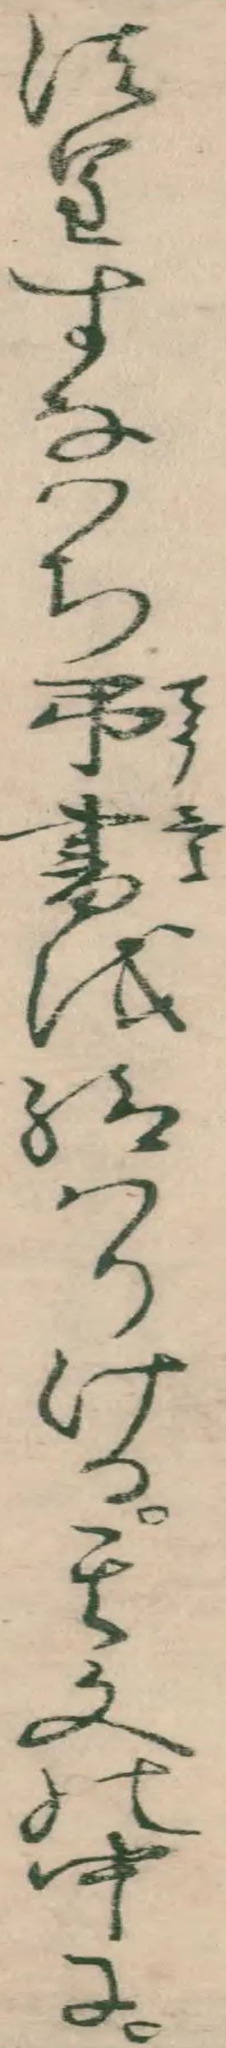法皇すなはち弔書を給はりける。其文の中に。
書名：弘法大師御本地 3巻. [3]
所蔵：国立国会図書館 National Diet Library, JAPAN
